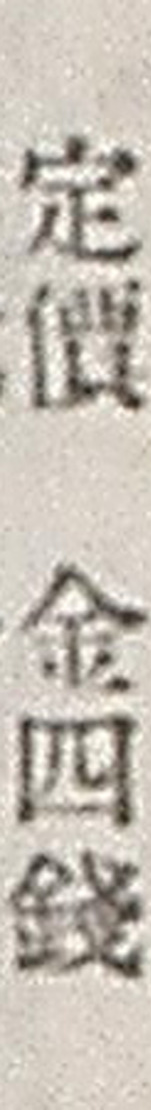郵税金四銭
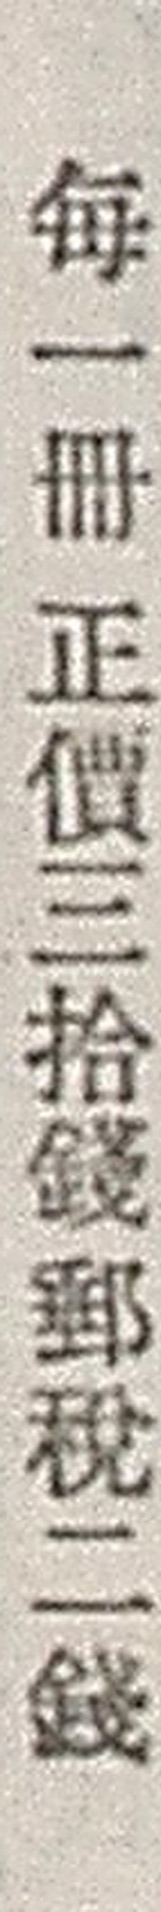毎一冊正価三拾銭郵税二銭
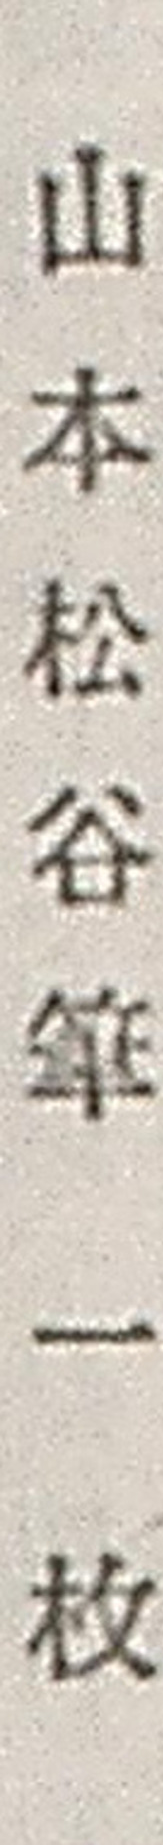山本松谷筆一枚
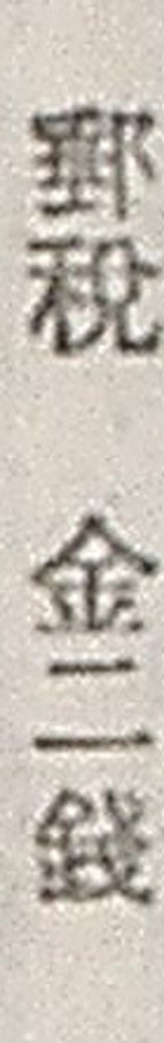郵税金四銭
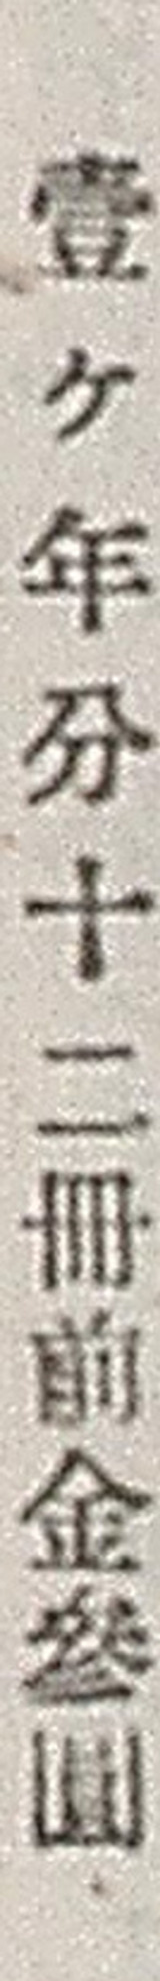一ケ年分十二冊前金三円
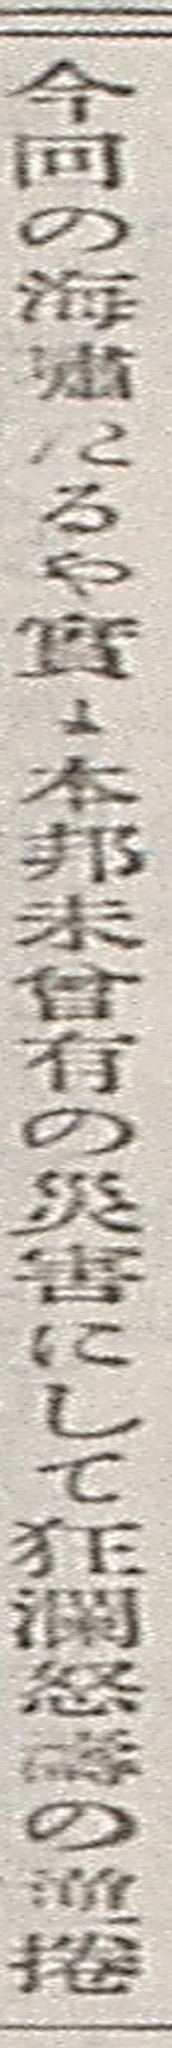今回の海嘯たるや実に本邦未曾有の災害にして狂瀾怒濤の逆捲
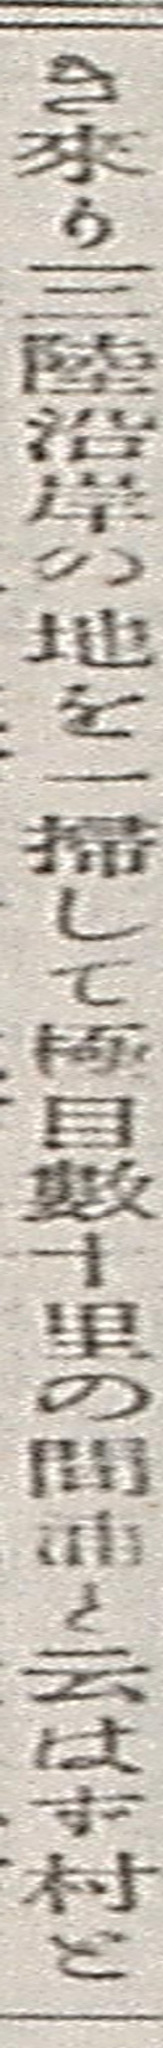き来り三陸沿岸の地を一掃して極目数十里の間浦と云はず村と
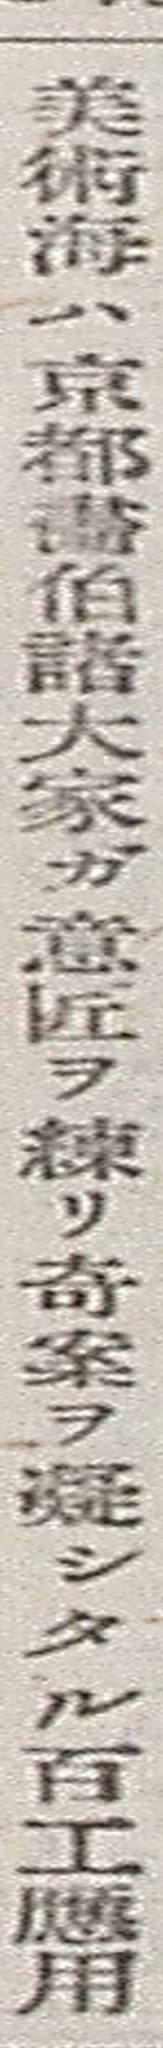美術海ハ京都画伯諸大家ガ意匠ヲ練リ奇案ヲ凝シタル百工応用
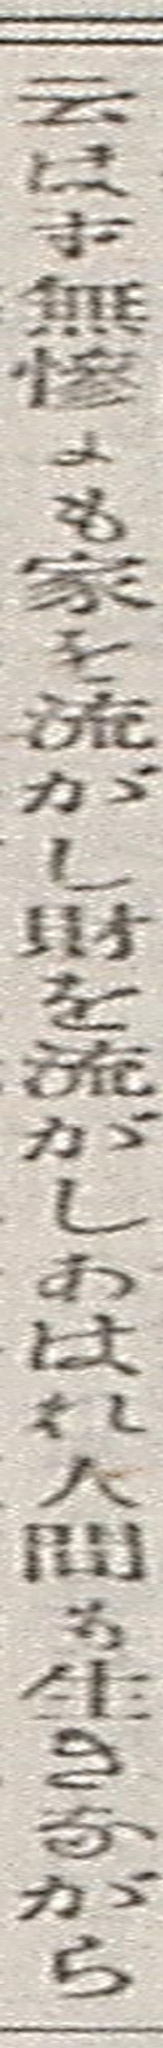云はず無惨にも家を流がし財を流がしあはれ人間も生きながら
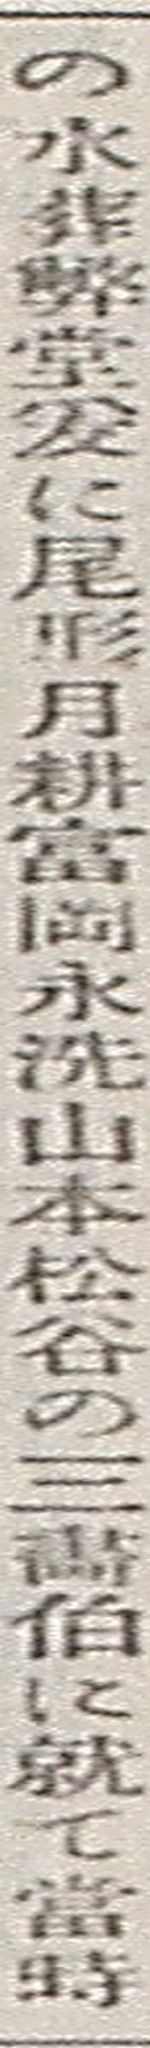の水葬弊堂爰に尾形月耕富岡永洗山本松谷の三画伯に就て当時
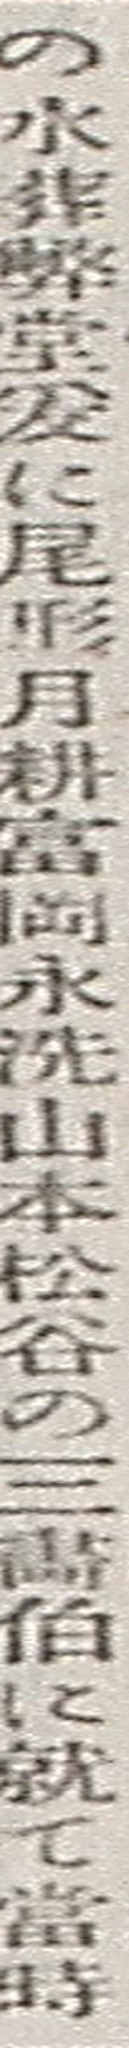の水葬弊堂爰に尾形月耕富岡永洗山本松谷の三画伯に就て当時
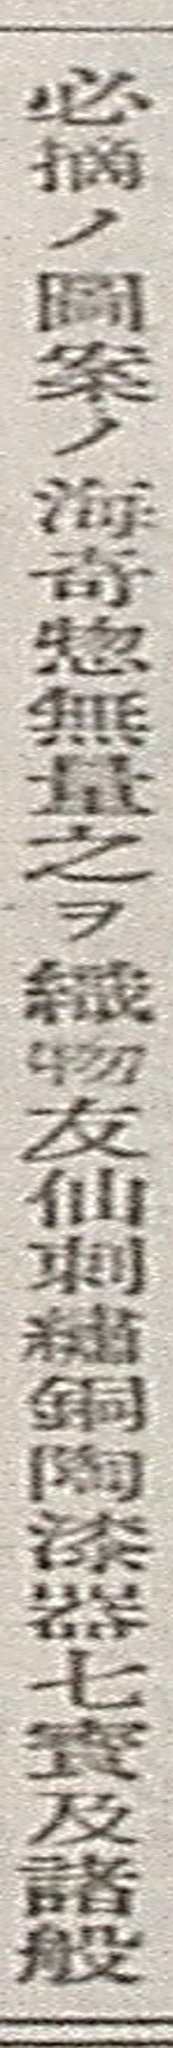必摘ノ図案ノ海奇惣無量之ヲ織物友仙刺繍銅陶漆器七宝及諸般
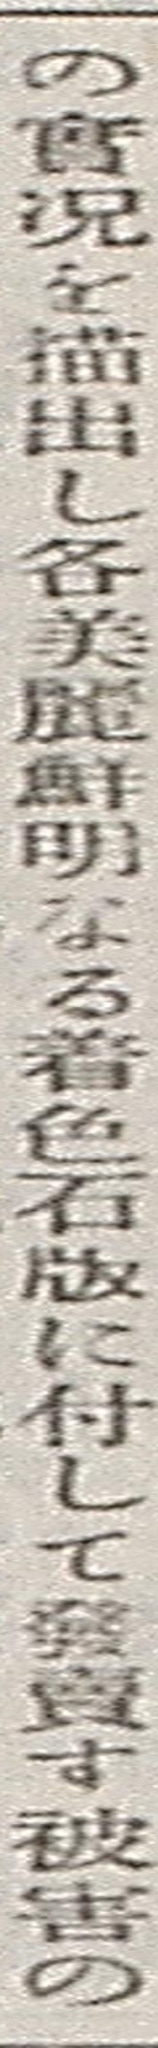の実況を描出し各美麗鮮明なる着色石版に付して発売す被害の
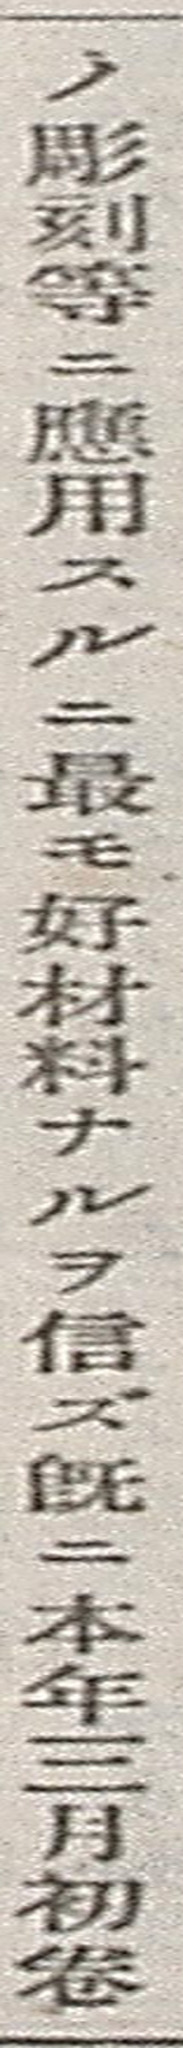ノ彫刻等ニ応用スルニ最モ好材料ナルヲ信ズ既ニ本年三月初巻
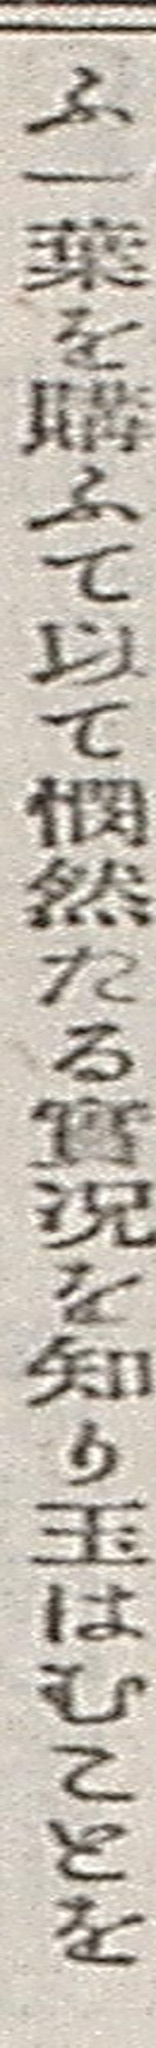ふ一葉を購ふて以て憫然たる実況を知り玉はむことを
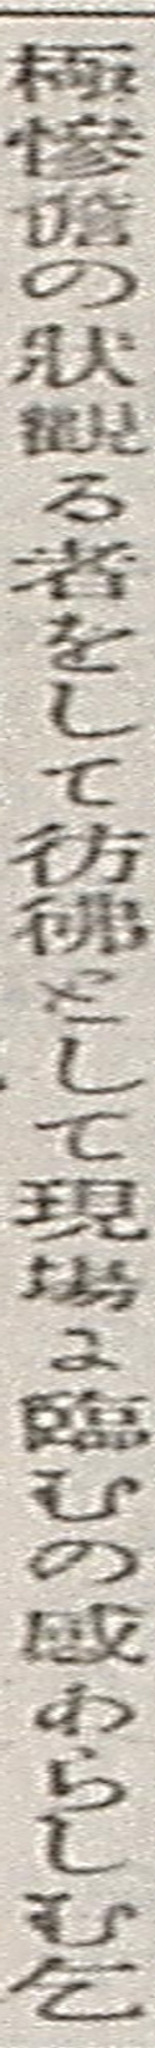極惨憺の状観る者をして彷彿として現場に臨むの感あらしむ乞
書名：風俗畫報臨時増刊第百二十四號　洪水地震被害録（上）
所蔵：東京大学地震研究所図書室 Earthquake Research Institute Library, The University of Tokyo, JAPAN
